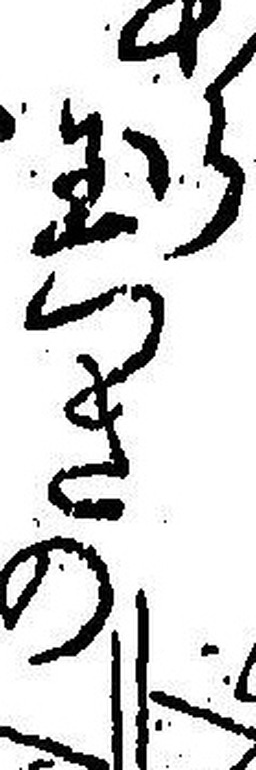玉つきの
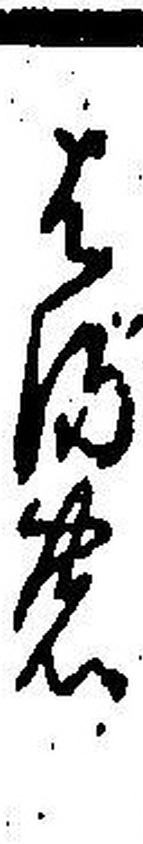はるの
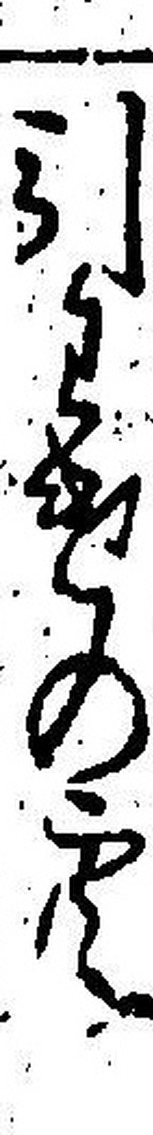引わけの空
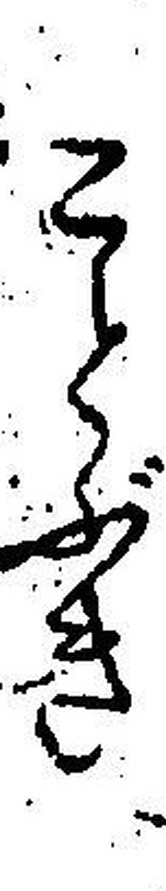ことぶき

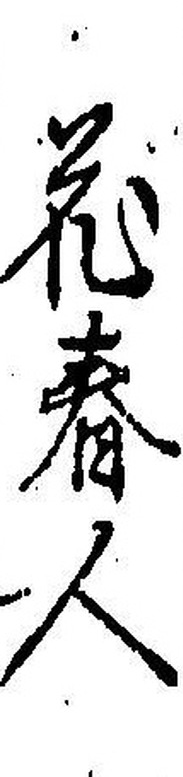花春人
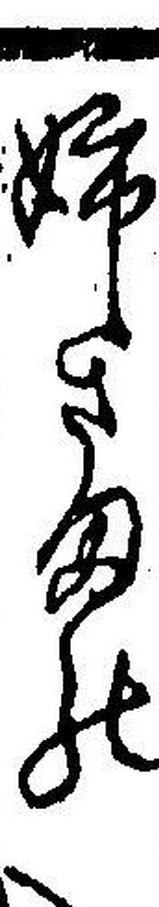姉さまの
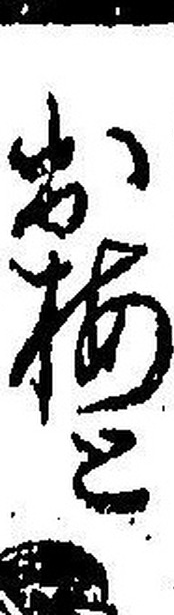お梅と
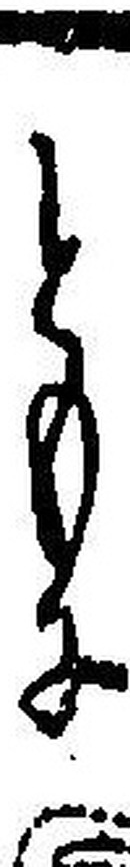ともに
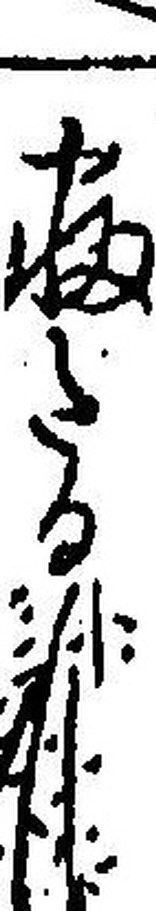あたる
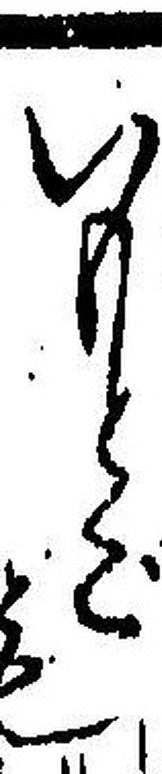いもとご
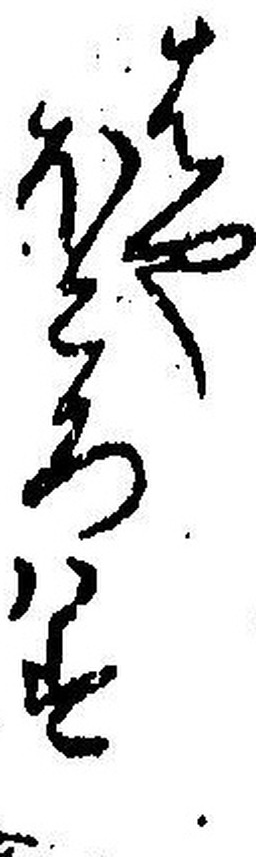ほころはす
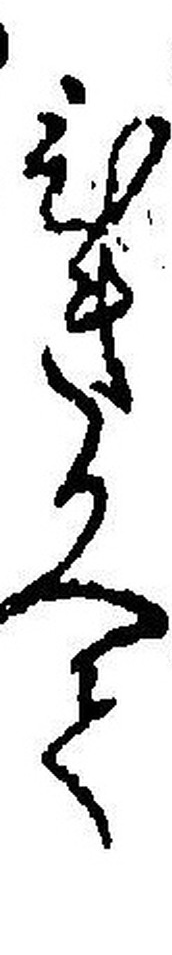ひきかへて
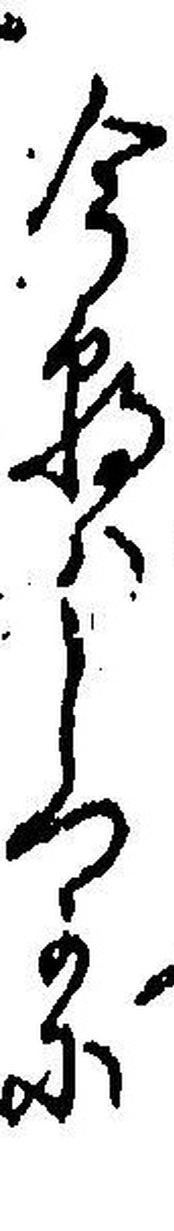今朝はしつかに
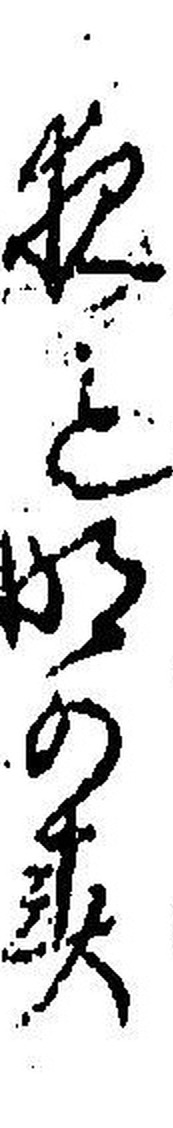夜も明の春
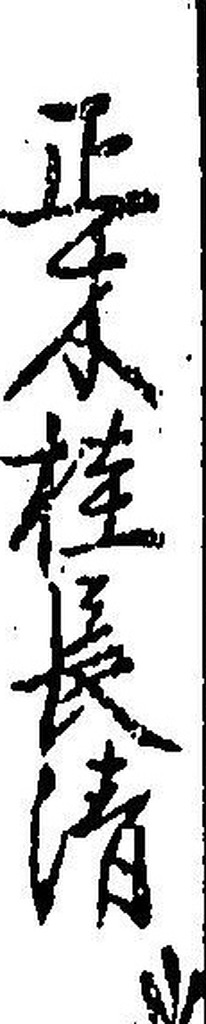正木桂長清
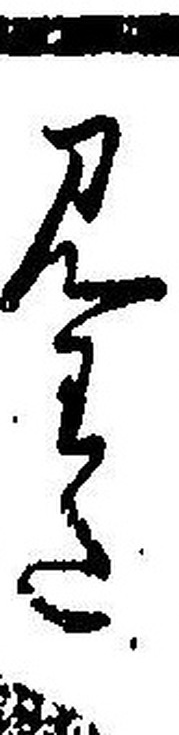見わた
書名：どうれ百人一首 / 鹿都部真顔(狂歌堂)編
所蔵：東京大学総合図書館 General Library in the University of Tokyo, JAPAN
